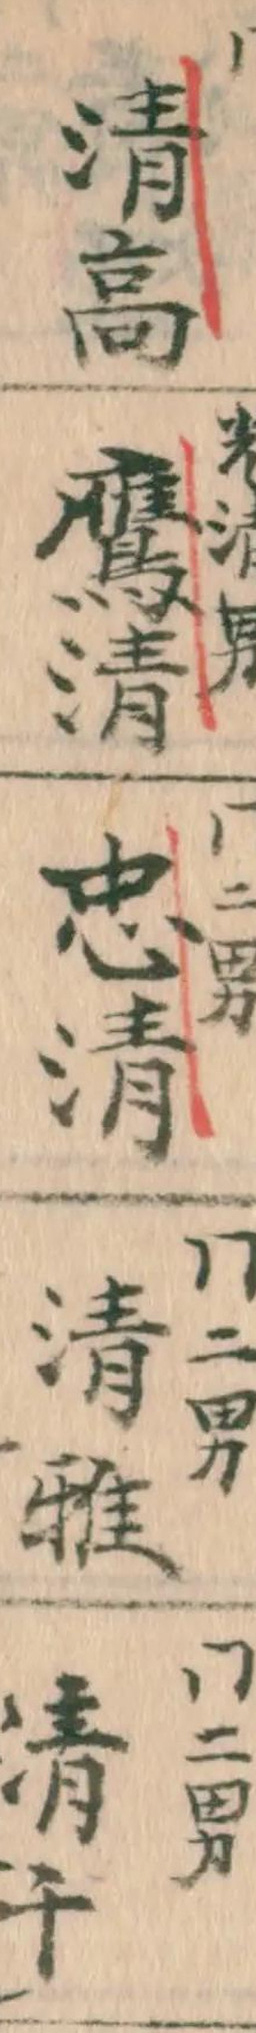清高鷹清忠清清雅清千
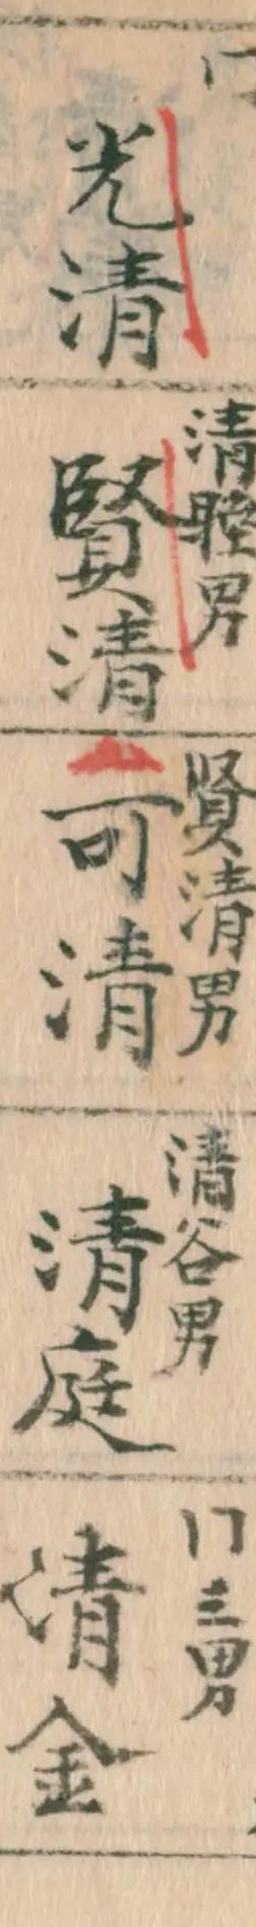光清賢清▲可清清庭清金
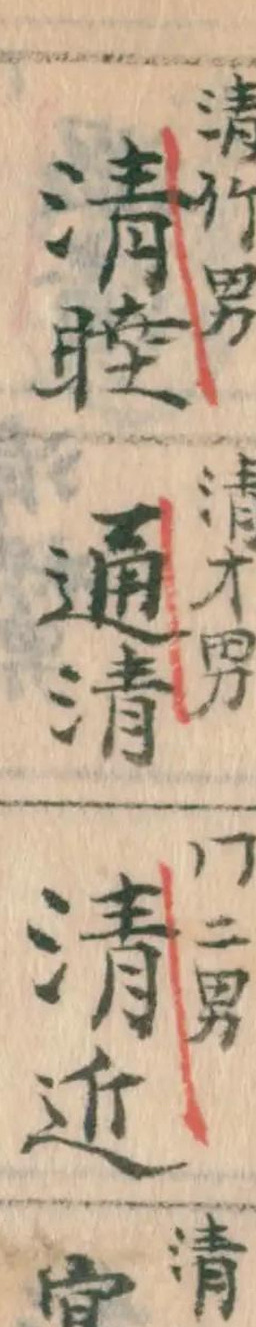清睦通清清近寔清
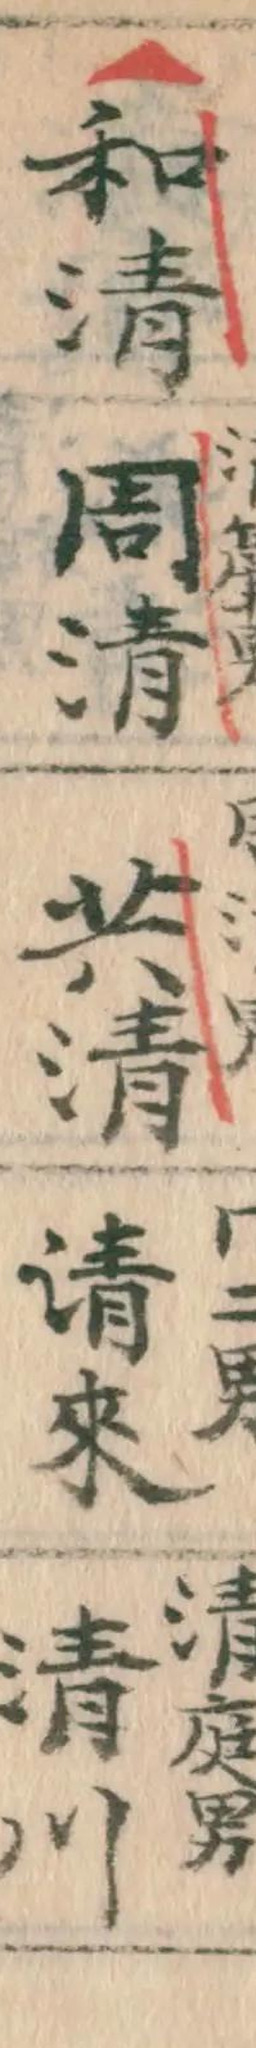▲和清周清共清清来清川
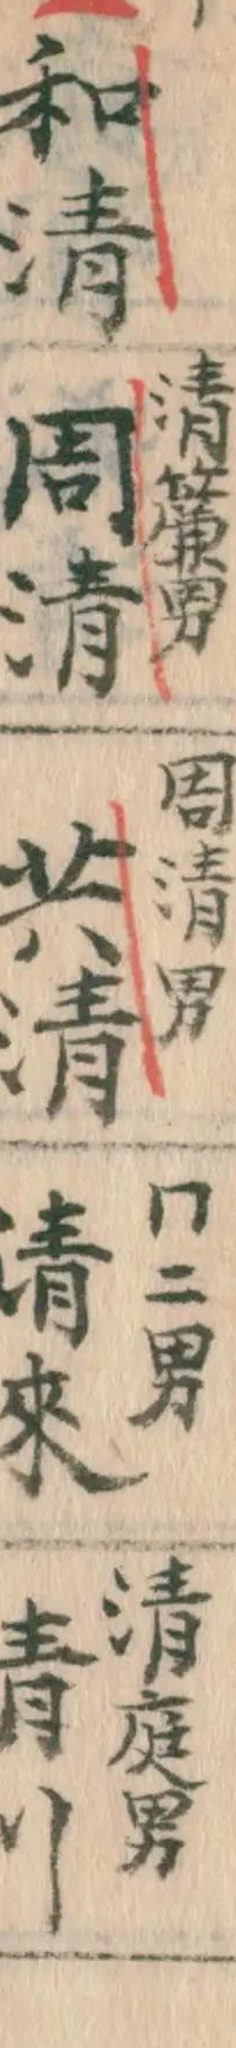▲和清周清共清清来清川
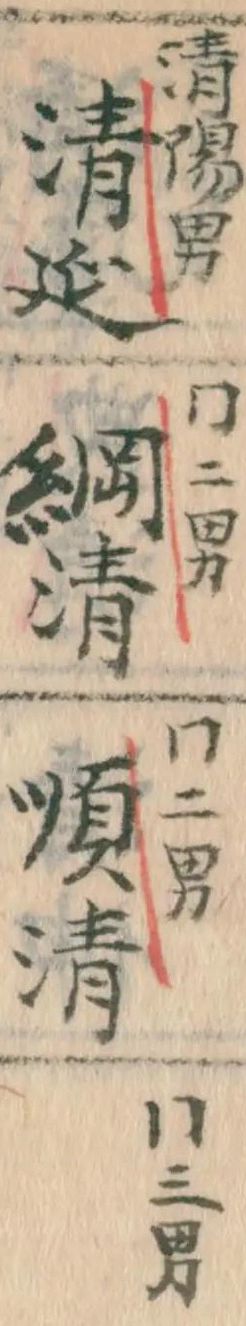清延綱清順清
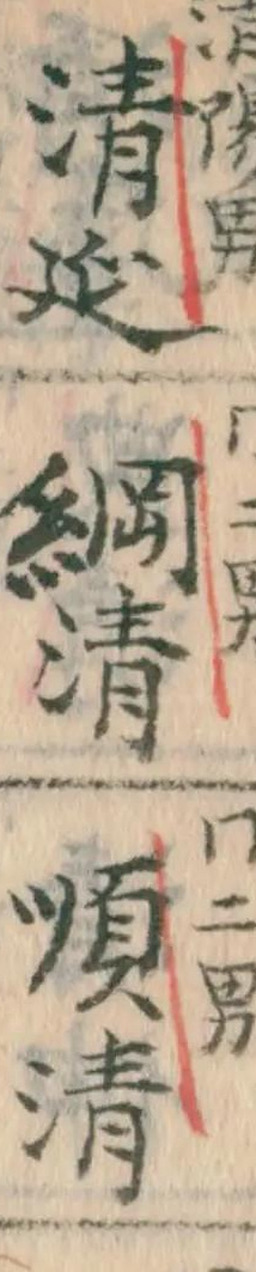清延綱清順清
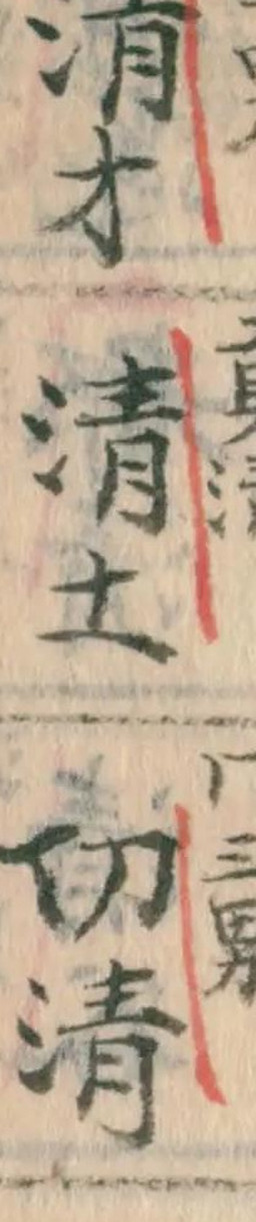清才清土切清

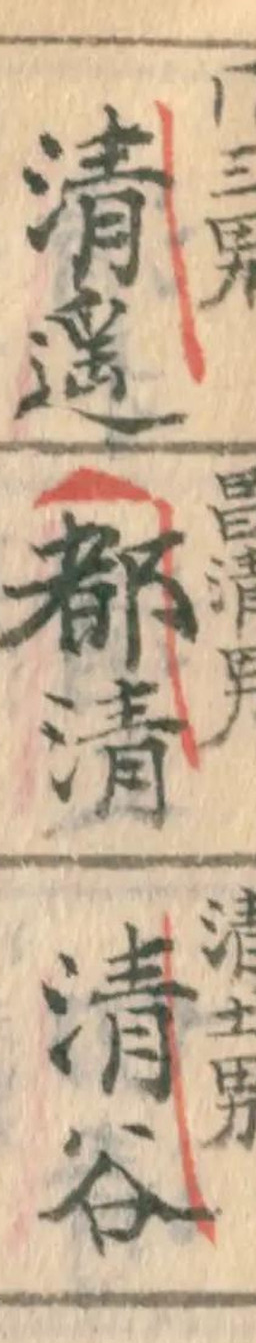清遙▲都清清谷
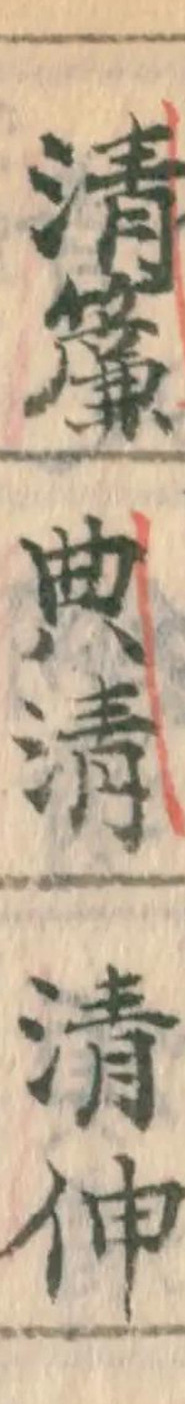清簾典清清伸
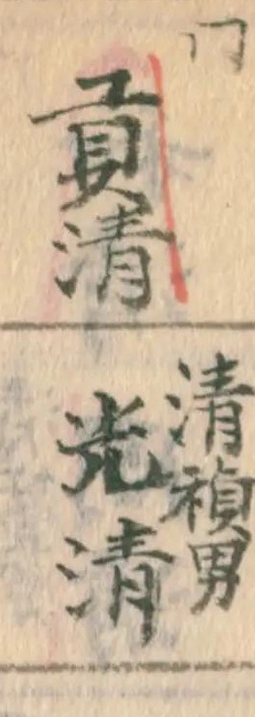貢清光清

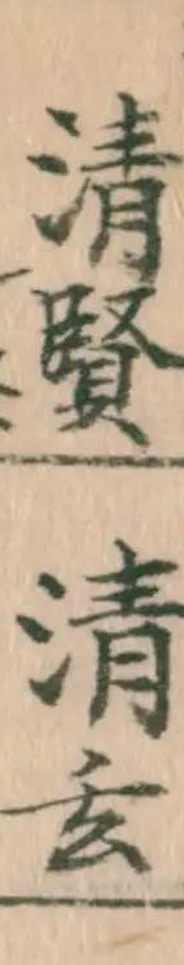清賢清玄
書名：賀茂社記録. 第24冊
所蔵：国立国会図書館 National Diet Library, JAPAN
